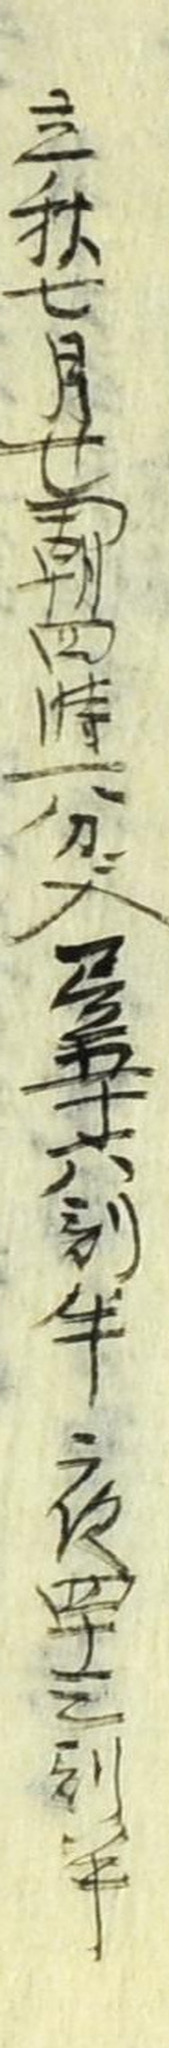立秋七月せつ朝四時一分ニ入昼五十六刻半夜四十三刻半
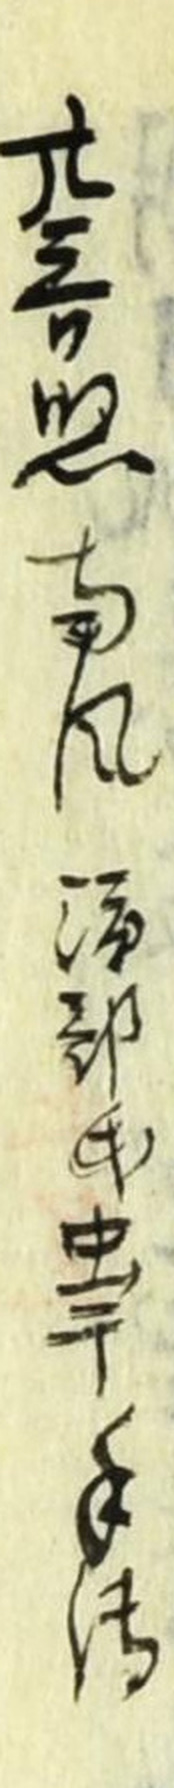廿三日照南風渡部氏虫干手伝
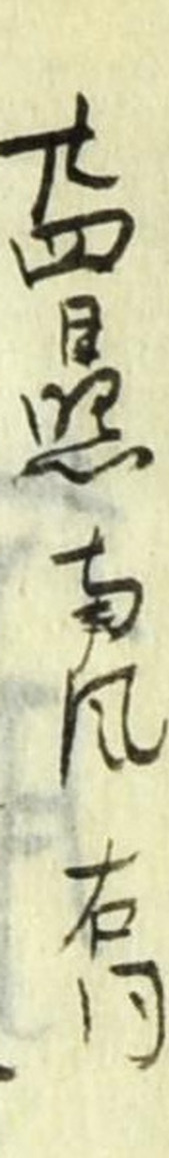廿四日照南風右同
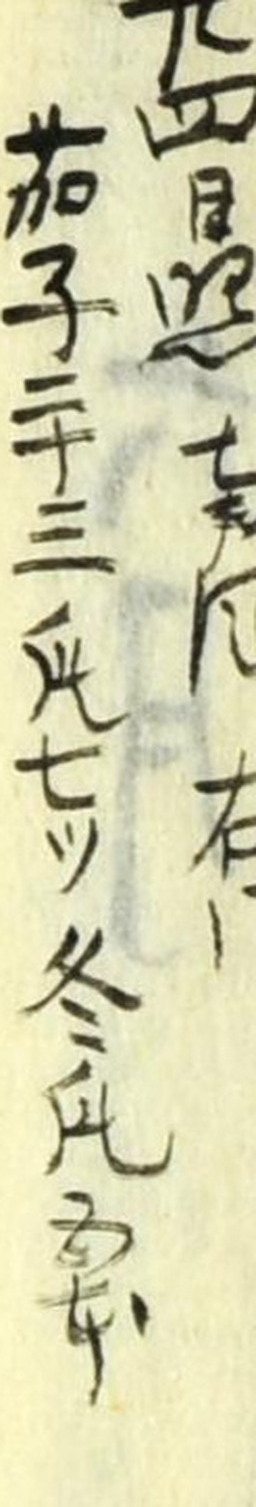茄子二十三瓜七ツ冬瓜五本

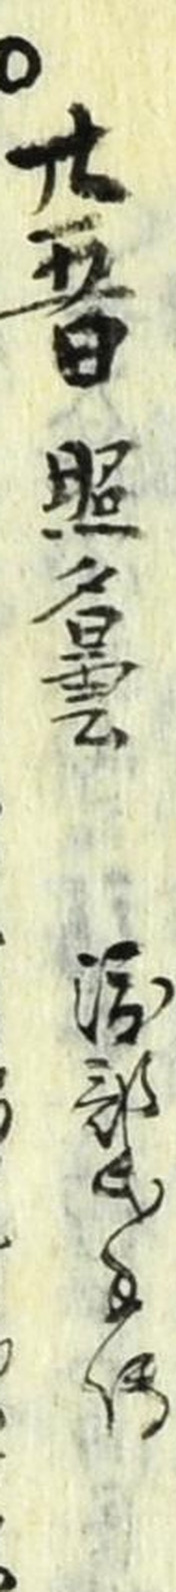○廿五日照夕曇渡部氏手伝
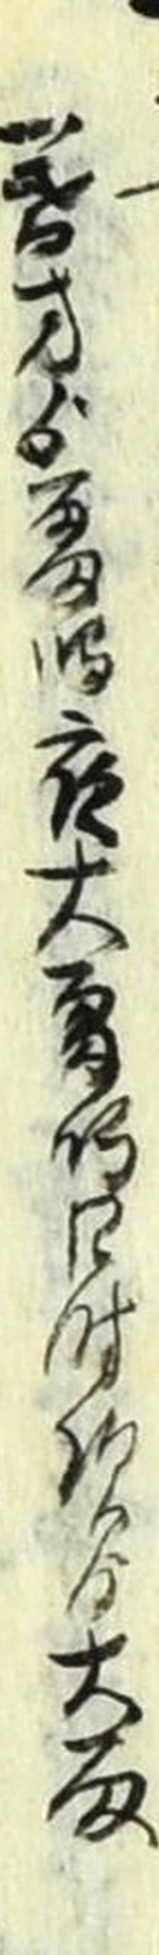暮方ゟ雷鳴夜大雷鳴四時頃ゟ大雨
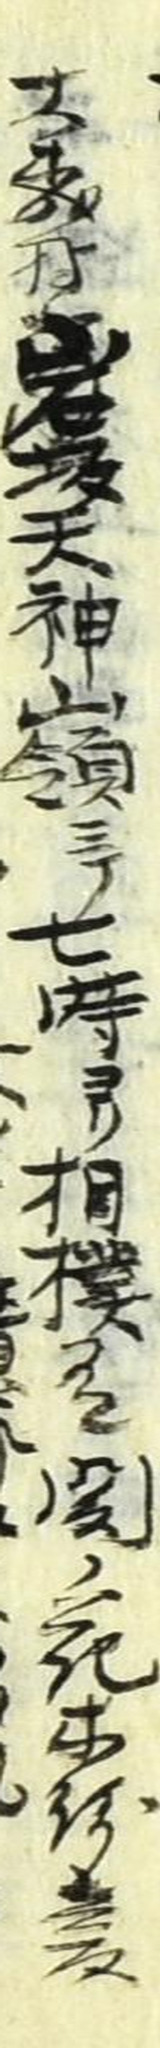大森村岩坂天神嶺ニテ七時ヨリ相撲有関ノ花木綿壱反
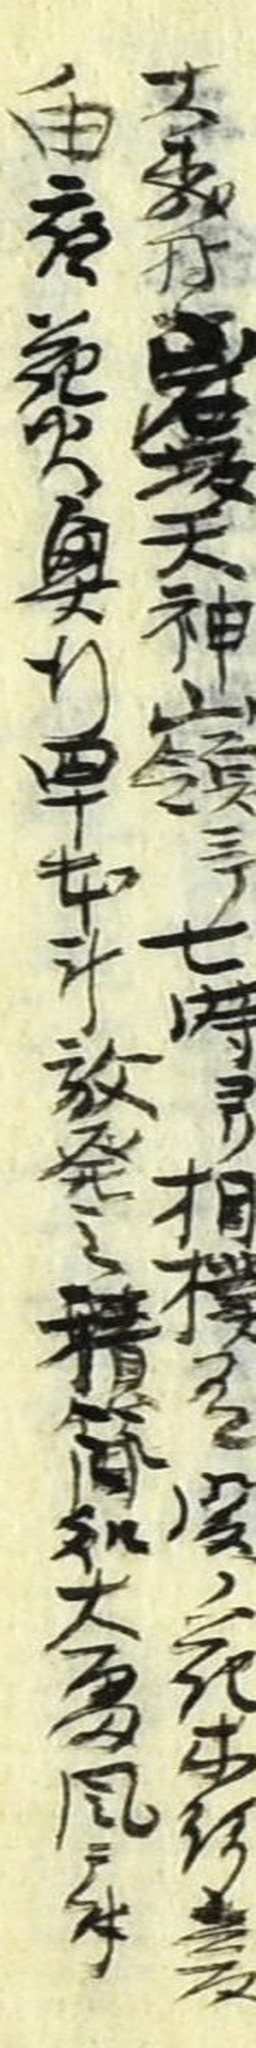の由夜花火興行四十本計放発之積筒処大雷風ニ付

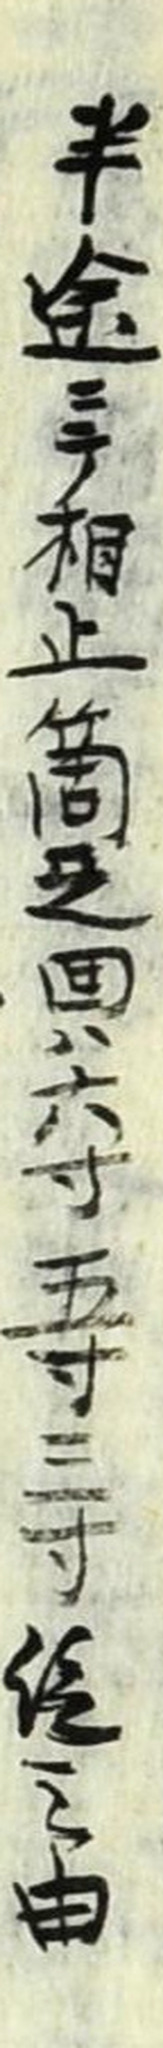半途ニテ相止筒先回ハ六寸五寸三寸位之由
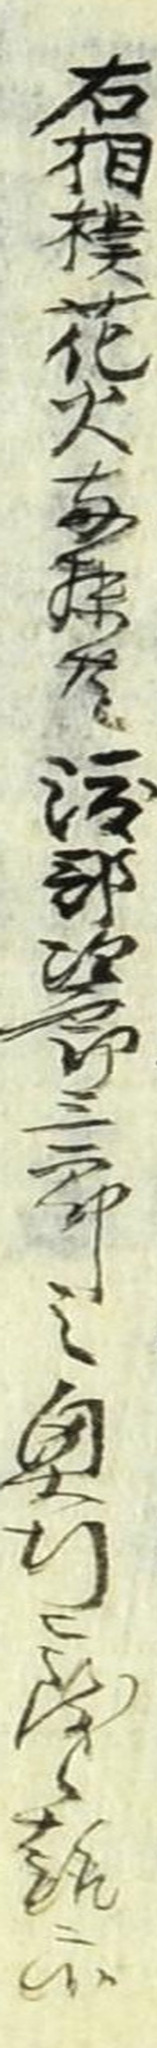右相撲花火両様共渡部次郎三郎之興行被致候趣ニ候
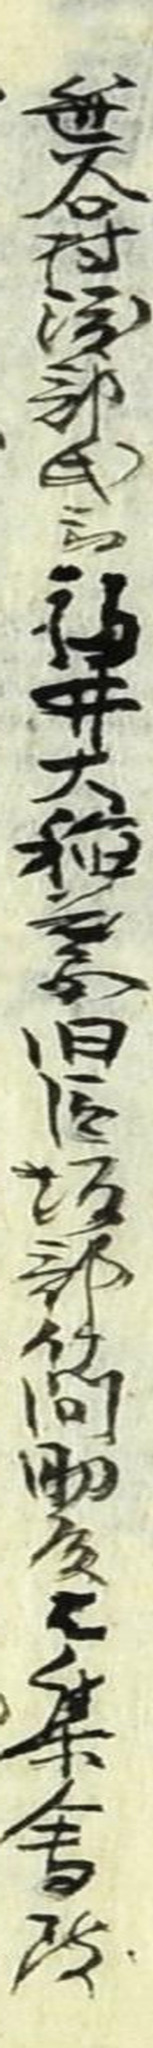笹谷村渡部氏ニ而福井大稲葉旧臣坂部簡助殿与集会致
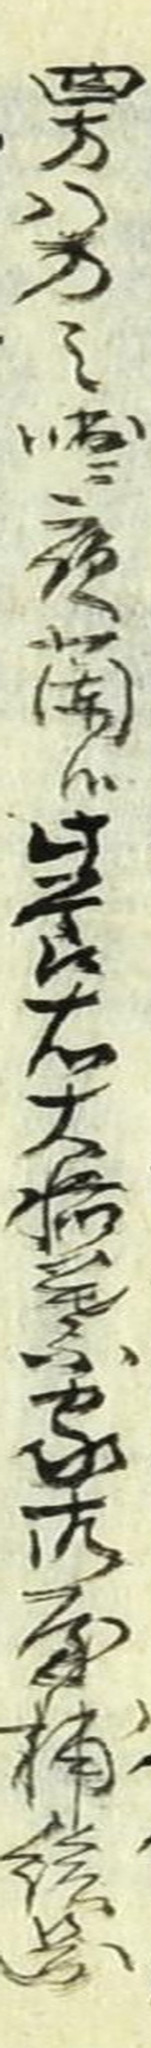四方八方之咄ニ夜蘭候此節右大稲葉家御屋鋪絵図
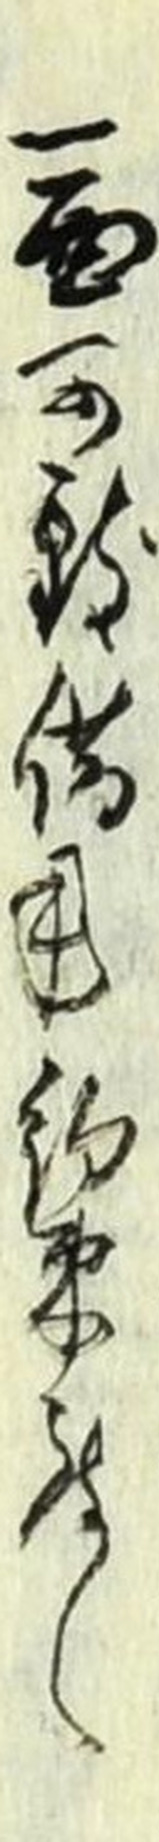一面可致借用約束致候
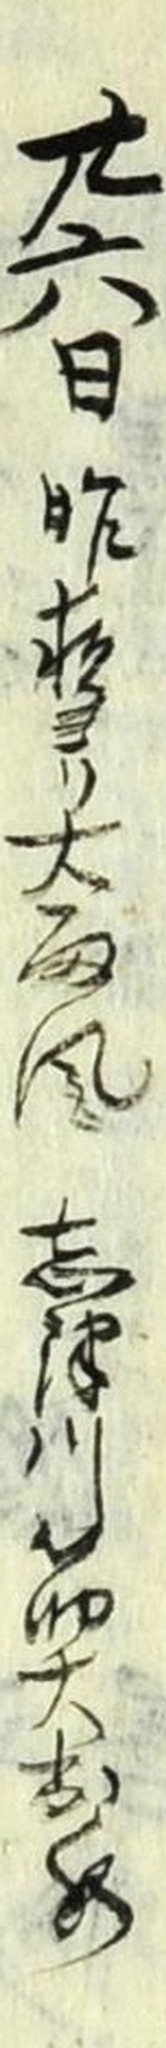廿六日昨夜ヨリ大雨風志津川筋大出水
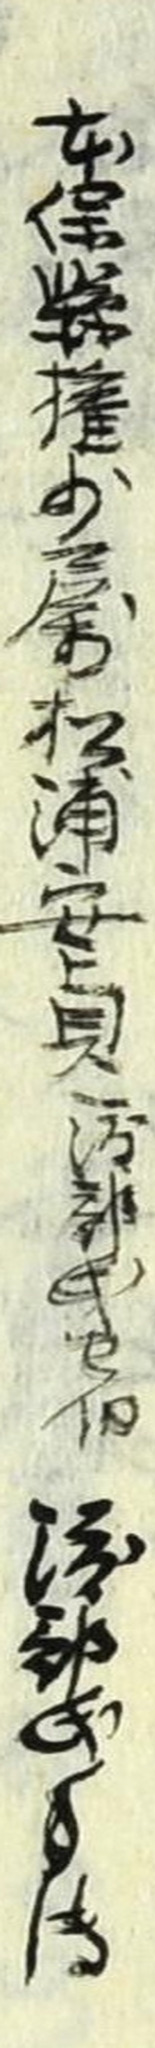本保県権少属松浦安貞渡部氏宿渡部氏手伝
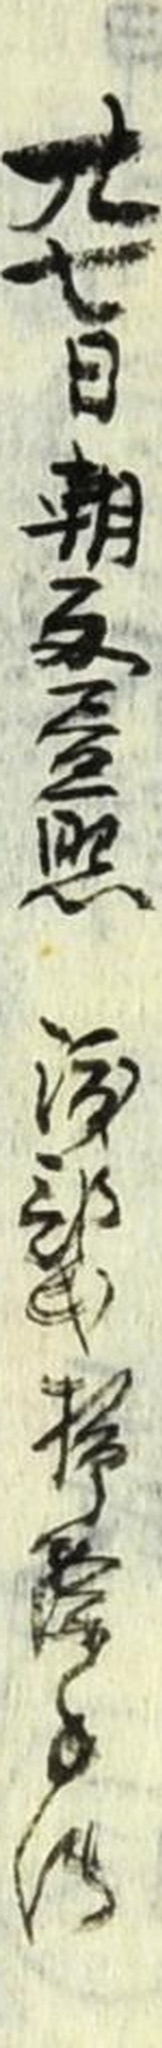廿七日朝雨昼照渡部氏掃除手伝
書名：（日記）
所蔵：福井県文書館 Fukui Prefectural Archives
